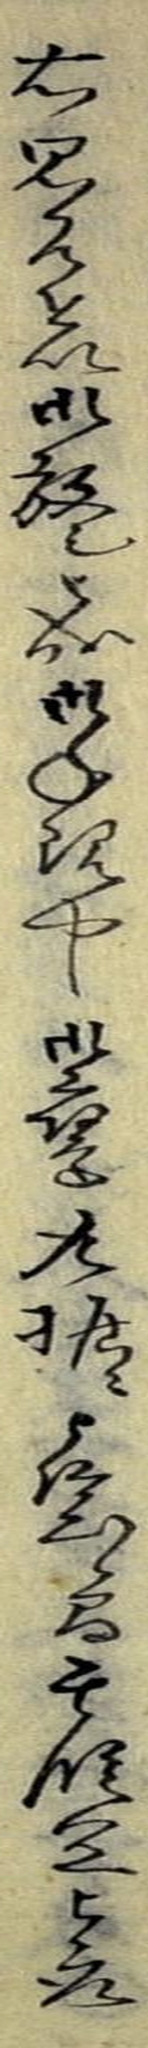右思召を以御放シ被成御年限中御鷹九据ニ被仰出候間其段宜被取
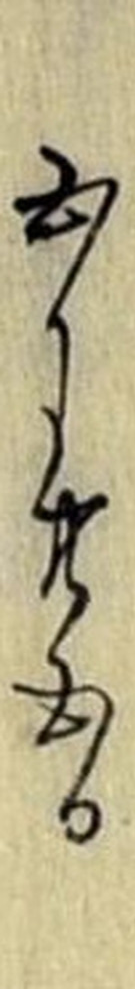五月廿五日
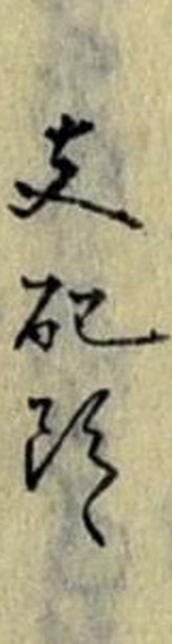支配頭へ
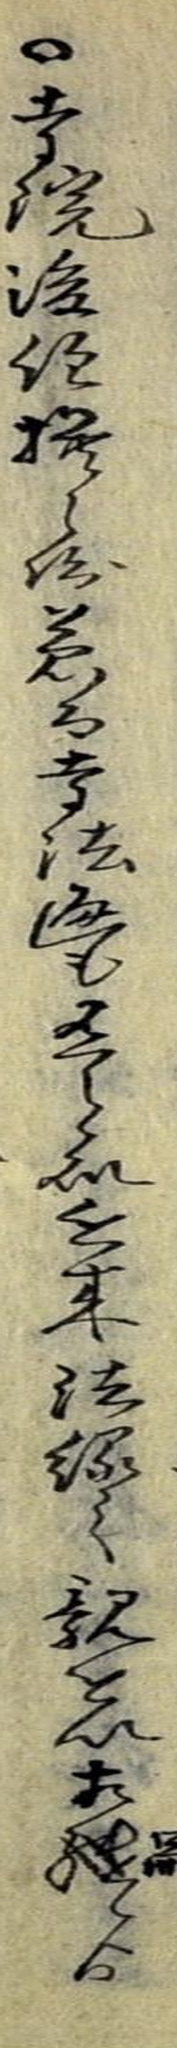〇寺院後住撰之儀兼而寺法通も有之候処近来法縁之親を以相継嗣候ゟ
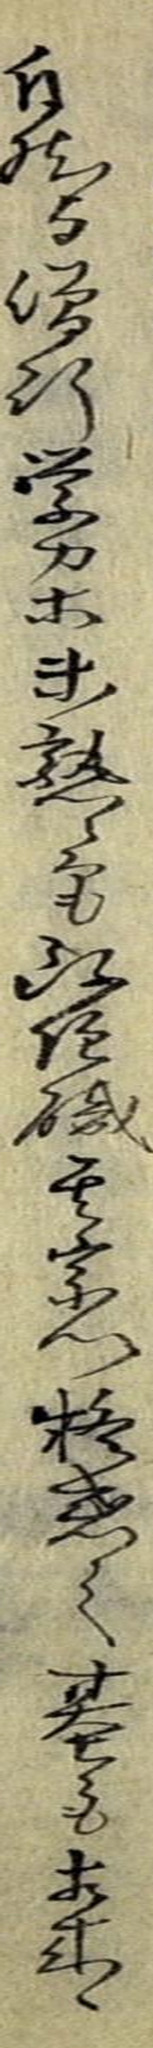自然与僧行学力等未熟ニ而も致住職其宗門疑惑之基ニも相来候
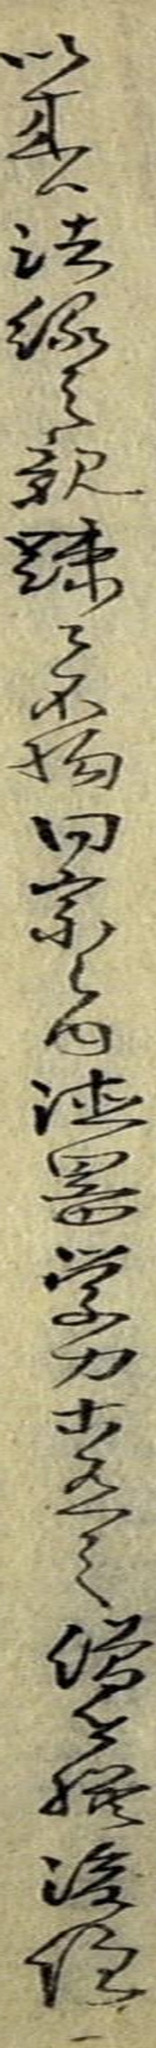以来ハ法縁之親疎ニ不拘同宗之内徳器学力等有之僧を撰後住
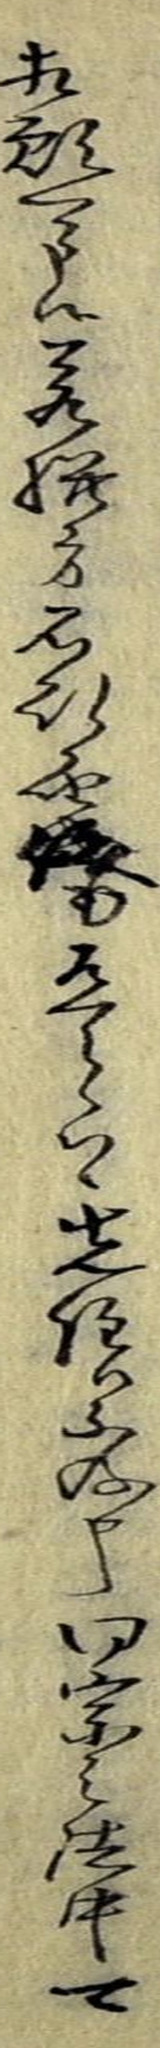相願可申候若撰方不行届儀も有之候ハヽ先住ハ不及申同宗之法中可
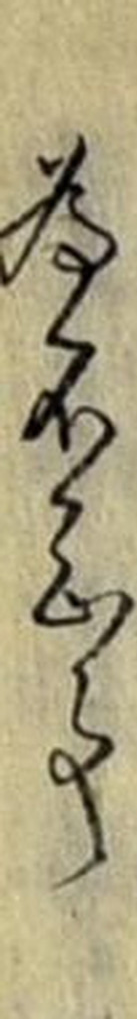為不正事
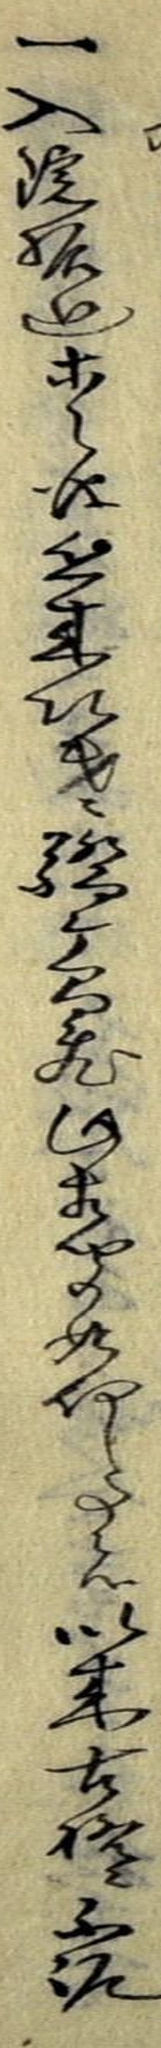一入院振廻等之儀近来次第ニ驕ケ間敷趣相聞如何之事ニ候以来古格ニ不泥

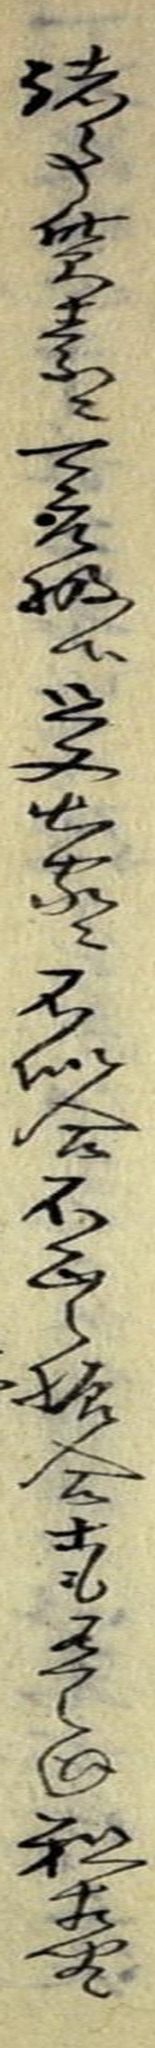諸事質素ニ可取扱候且又出家ニ不似合不正之振合等も有之趣粗相聞
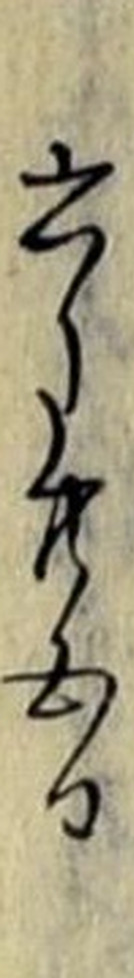六月廿五日
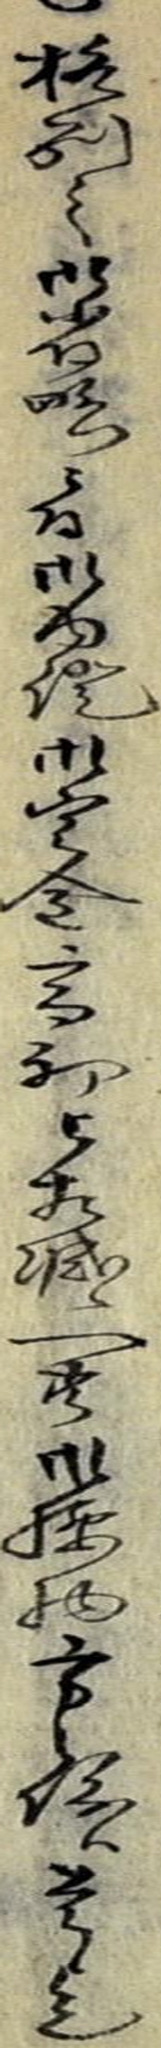〇格別之御省略ニ付御内証御定金高初被相減候へ共御腰物方之儀ハ是迄
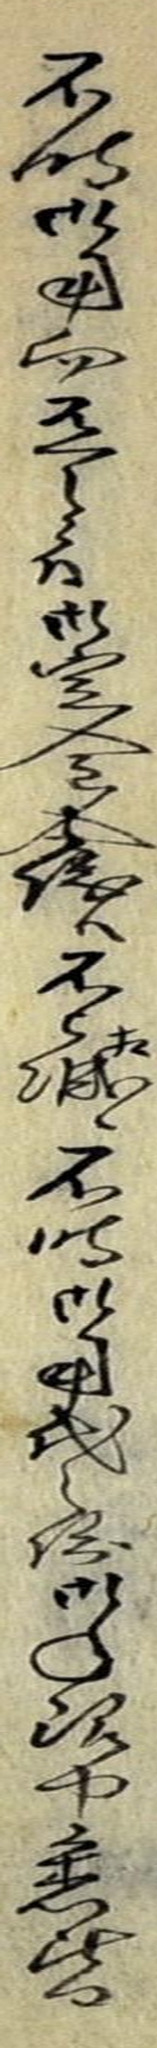不時御用向有之ニ付御定金入之儀ハ不被相減候不時御用代之儀御年限中悉皆
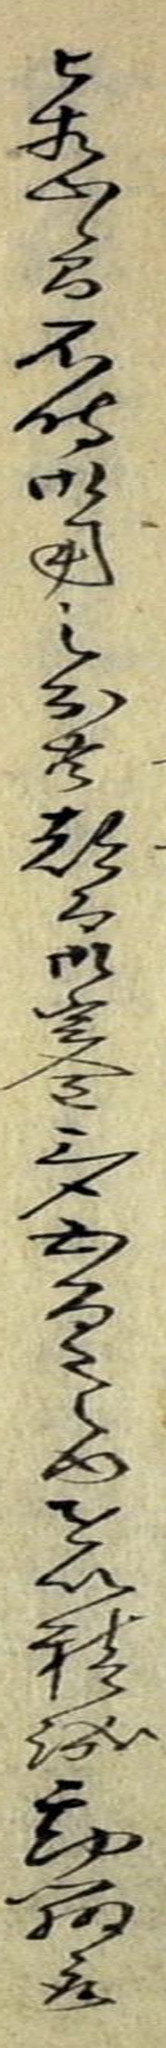被相止候間不時御用之分共都而御定金三貫五百匁之内を以精誠勘弁取
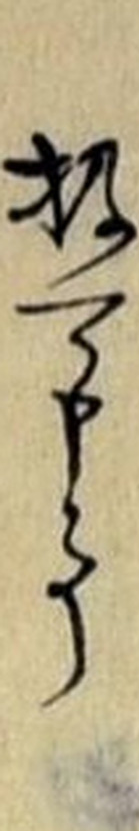扱可申事
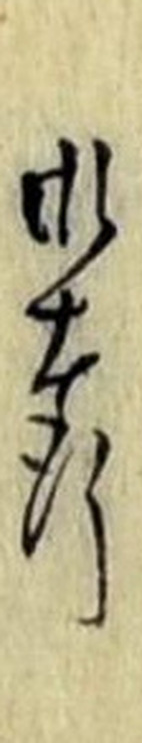御奉行
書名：命令之部 五
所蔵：福井県文書館 Fukui Prefectural Archives
